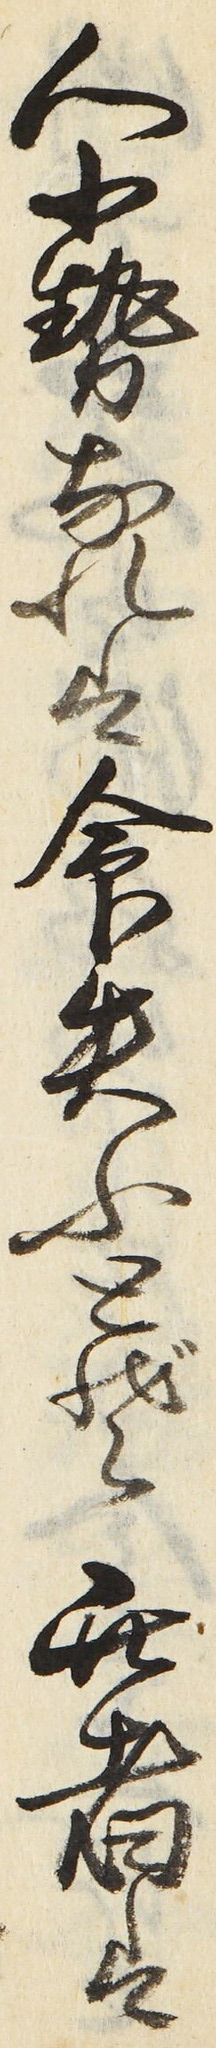人小勢なれば命失ふとそ此者は
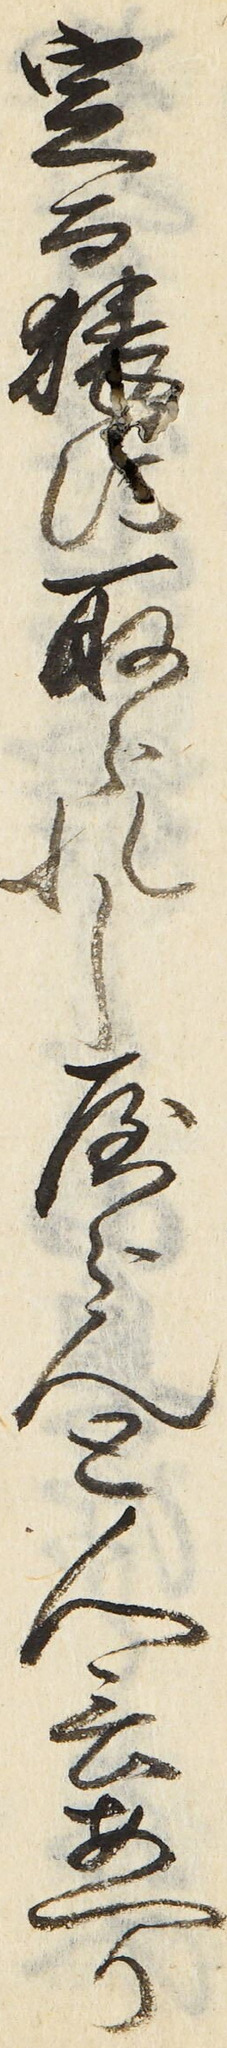定而猿に取られしやらんと人云あへり
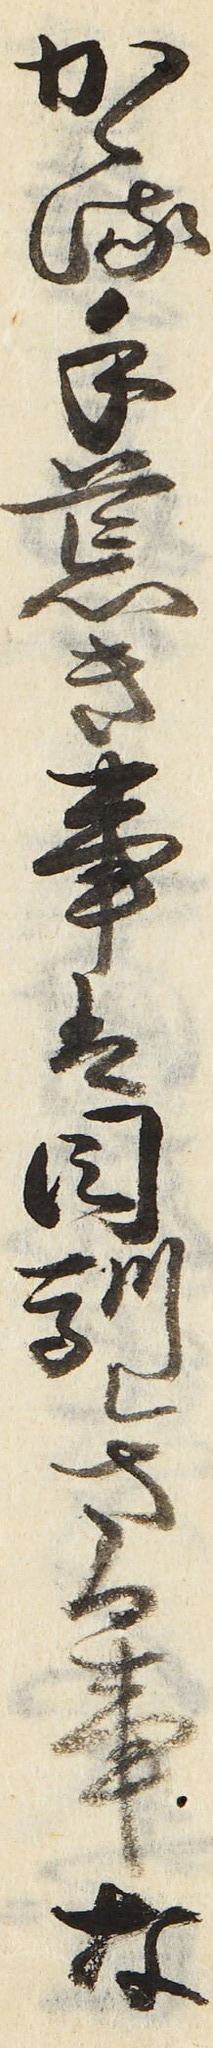かゝる手荒き事は目馴れさる事な
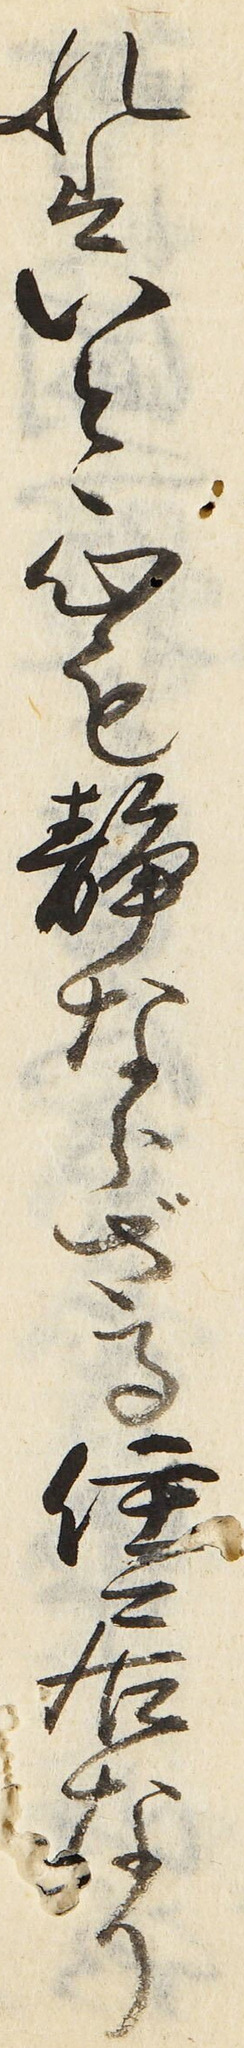れはいとゝ心も静ならざる住居なり
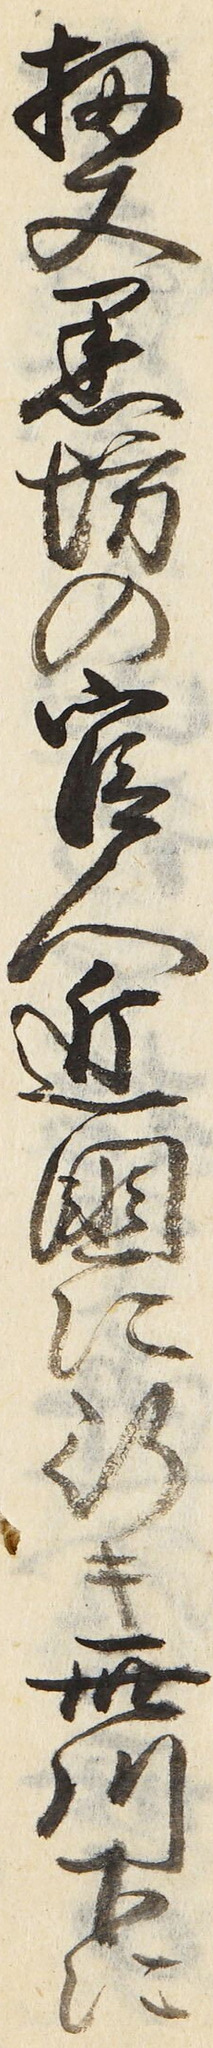扨又黒坊の官人近国に行き此川下に
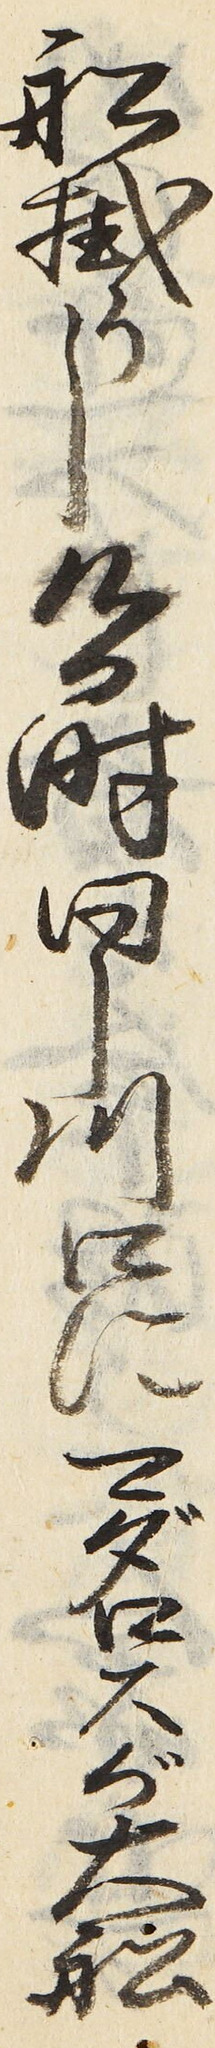船掛りしける時同し川口にマダロスが大船
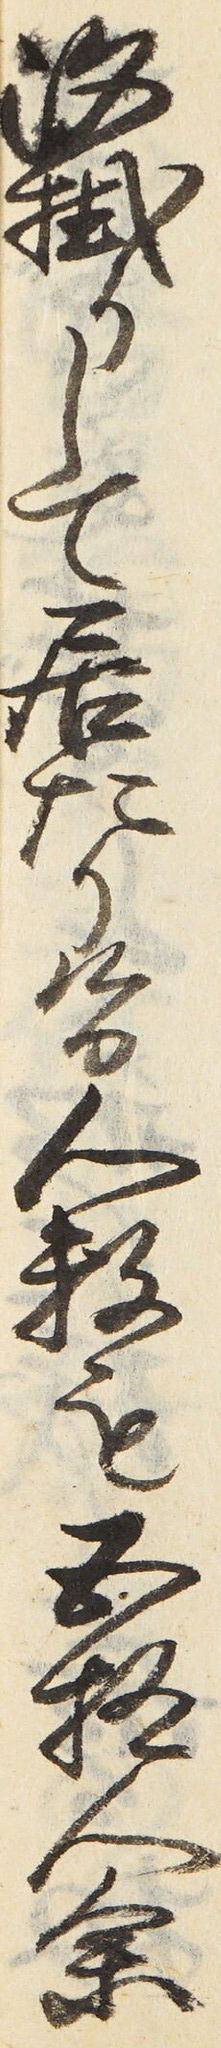汐掛りして居たりける人数も五拾人余
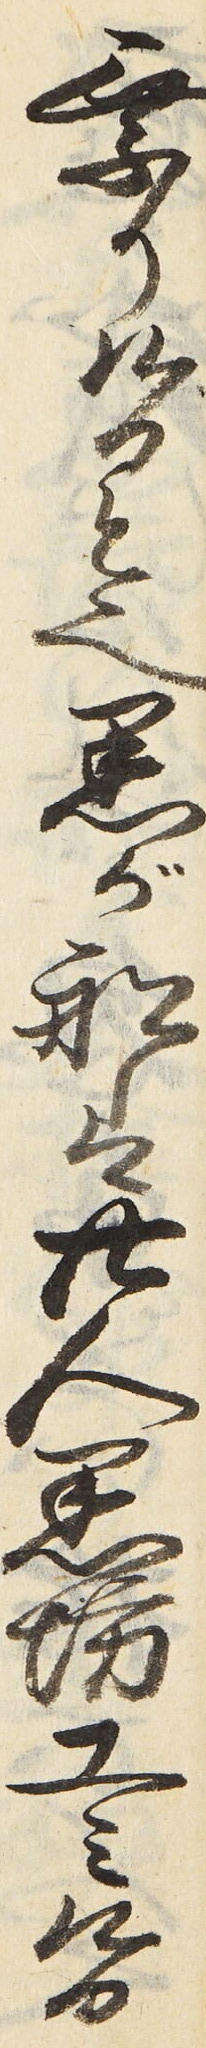乗りけると也黒が船は廿人黒坊工みける
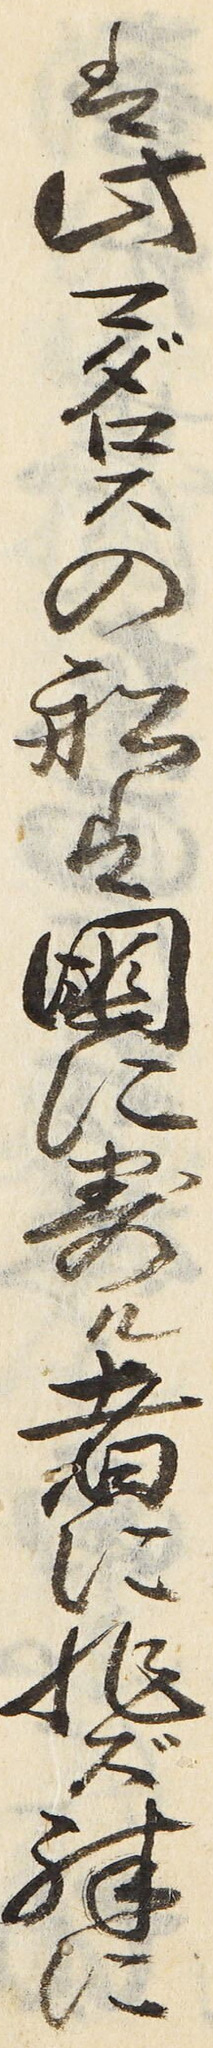は此マダロスの船は国に寄る者に非ず殊に
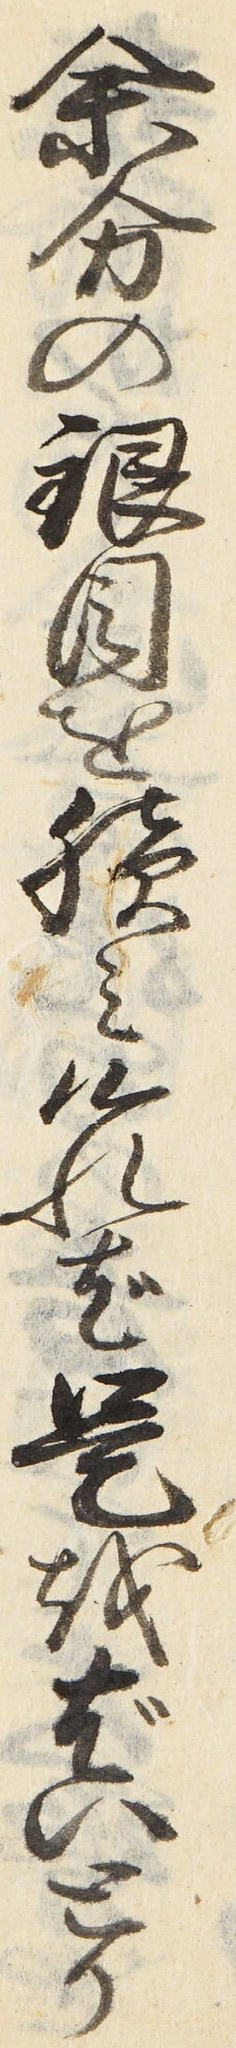余分の銀目を積みければ是をばいとり
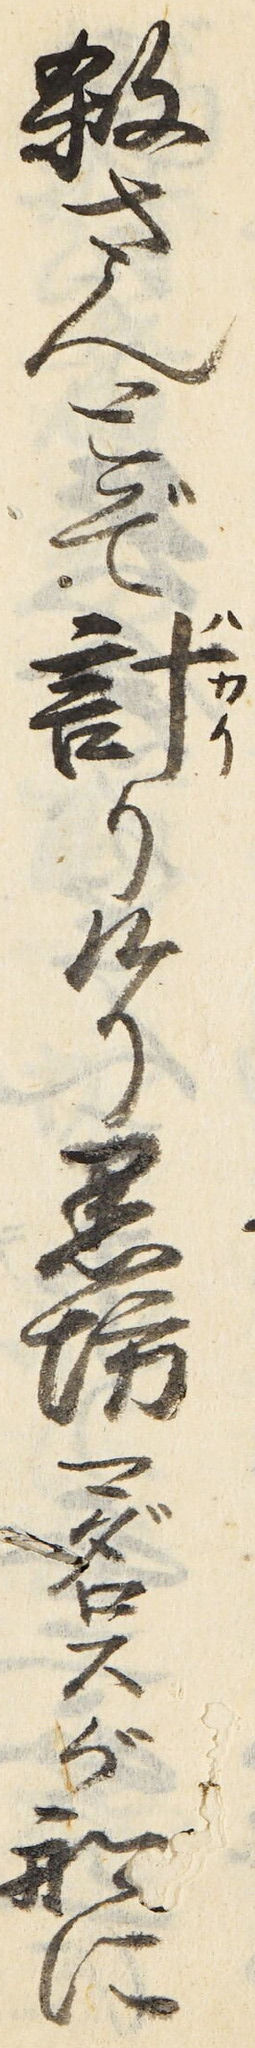殺さんとぞ計りけり黒坊マダロスが船に
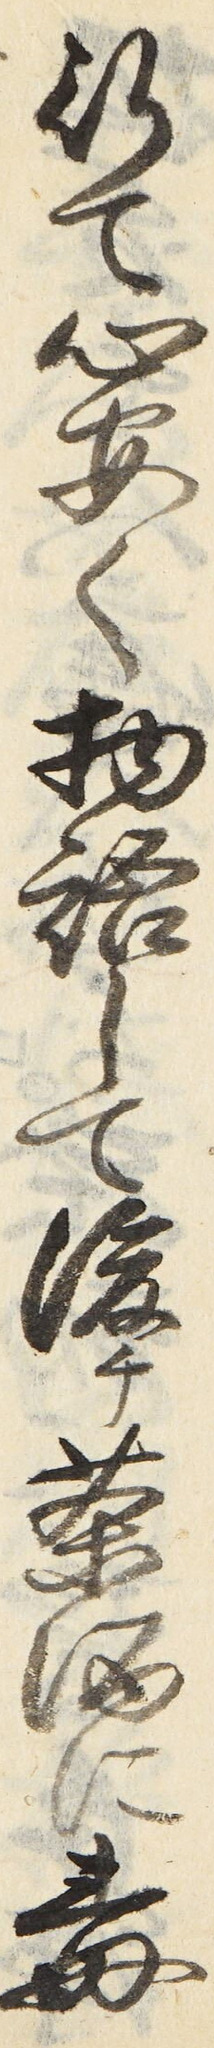行て心安く物語して後ち茶酒に毒
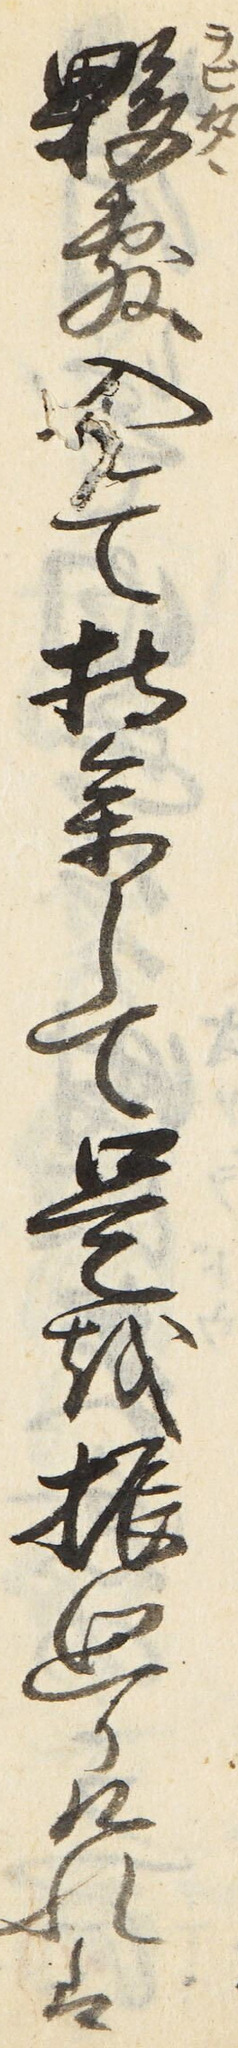夥敷入れて持参して是を振廻りけれは
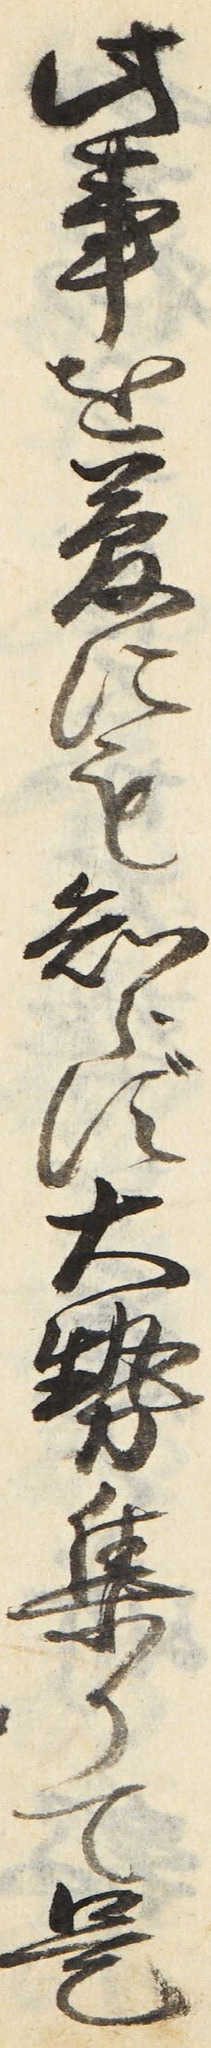此事を夢にも知らずに大勢集りて是
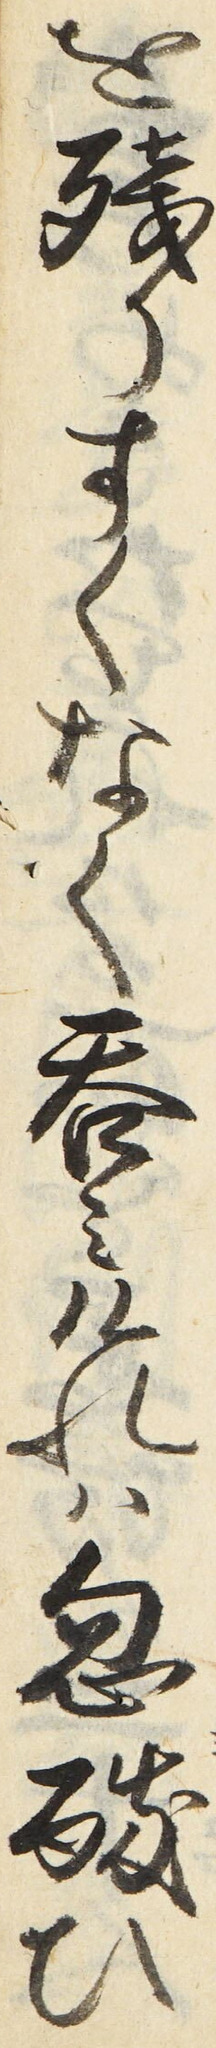を残りすくなく呑みけれは忽酔ひ

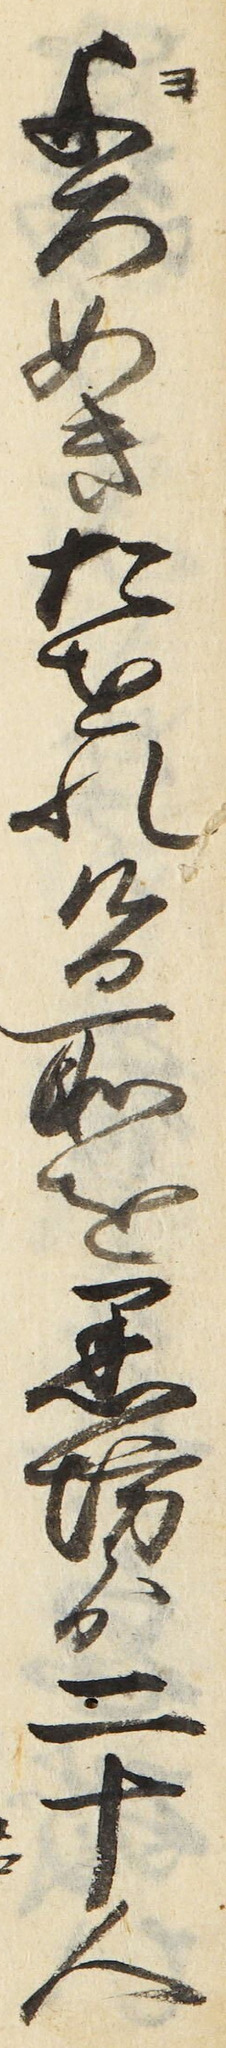よろめきたをれける所を黒坊ゟ二十人
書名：華夷九年録
